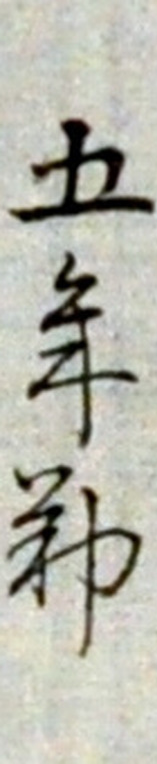五年勤
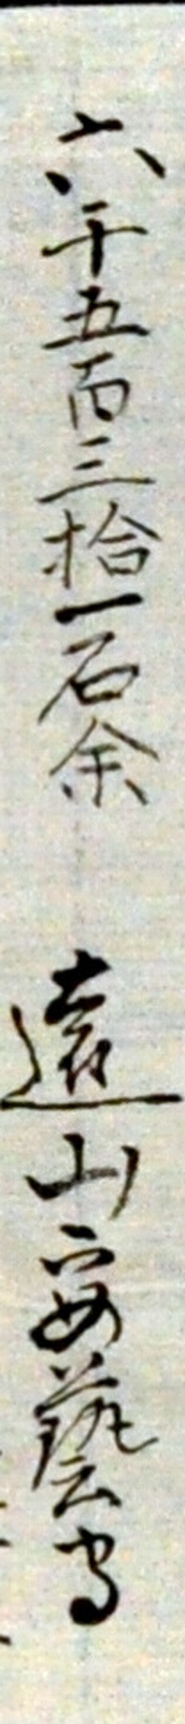六千五百三拾一石余遠山安藝守
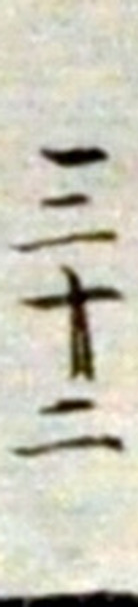三十二
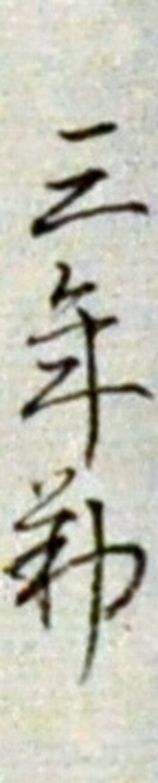三年勤

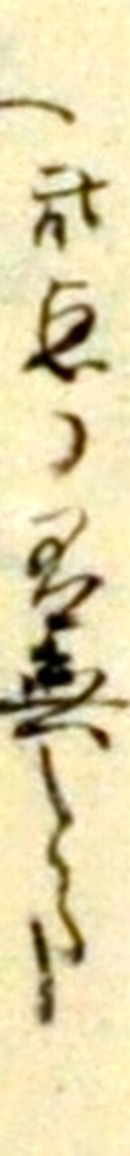此点ノ有無之事

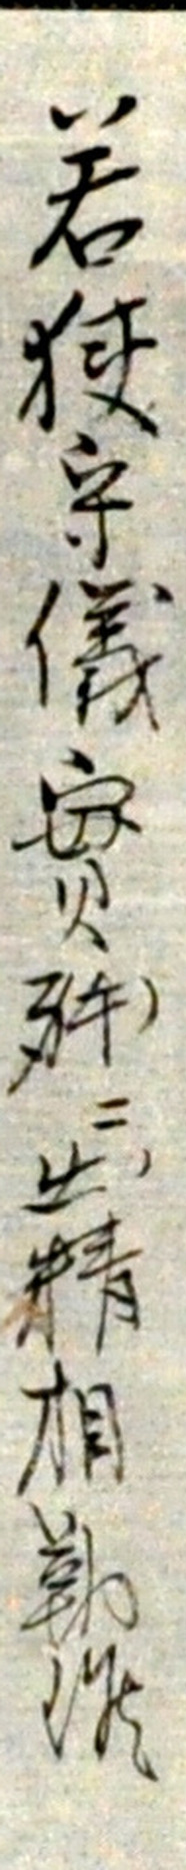若狭守儀實躰ニ出精相勤候
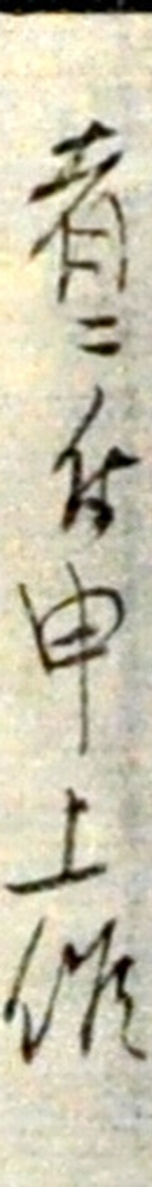者ニ付申上候
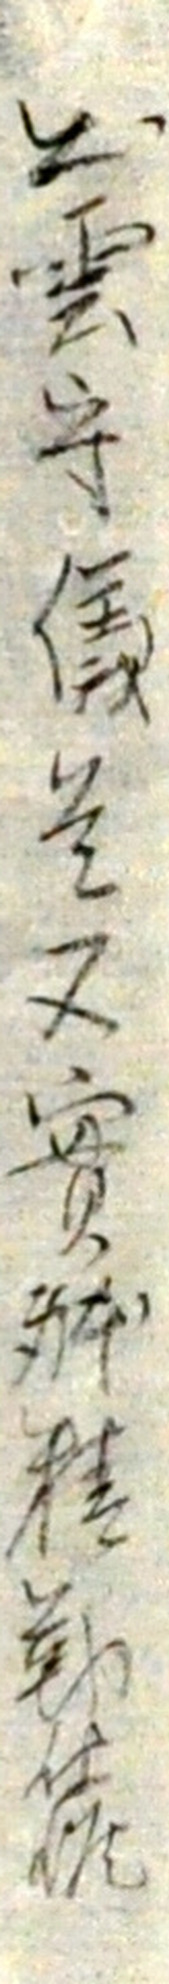出雲守儀是又實躰精勤仕候
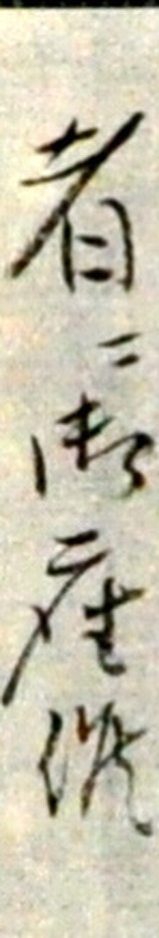者ニ御座候
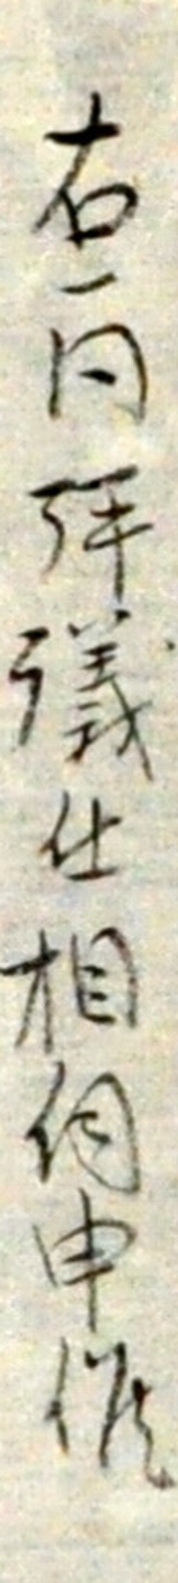右一同評議仕相伺申候

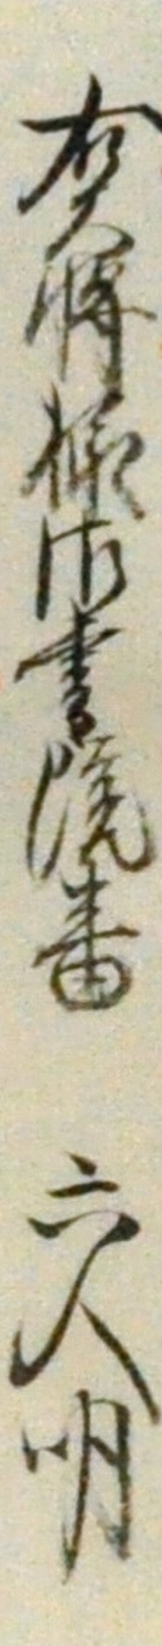右大将様御書院番六人明
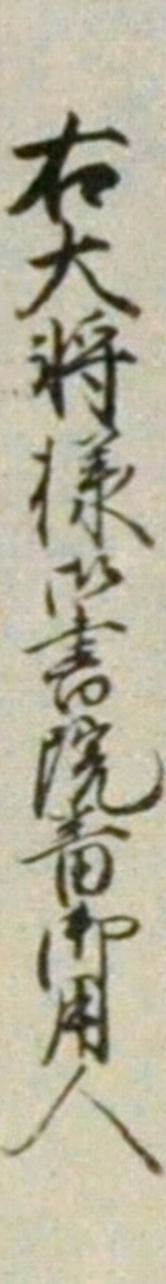右大将様御書院番御用人
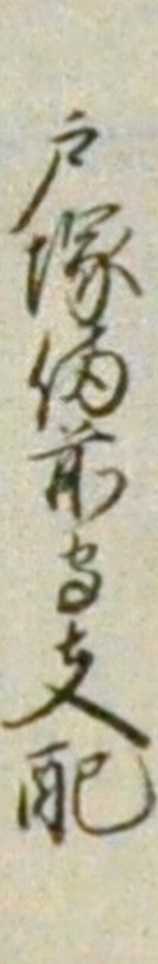戸塚備前守支配
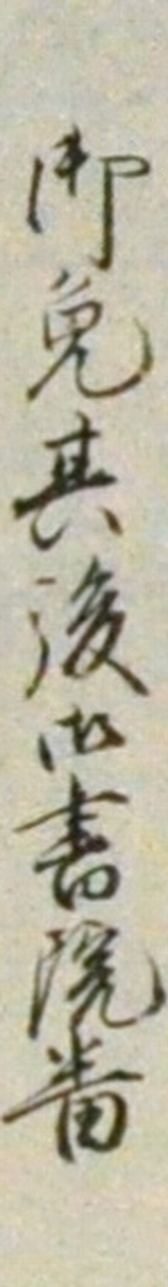御免其後御書院番
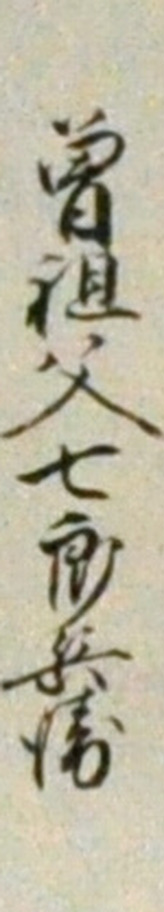曽祖父七郎兵衛
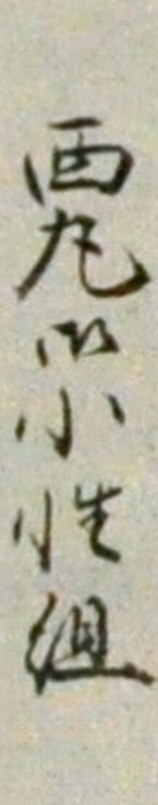西丸御小姓組
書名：若年寄御役中御調書付
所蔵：伊那市立高遠町図書館・合同会社AMANE
